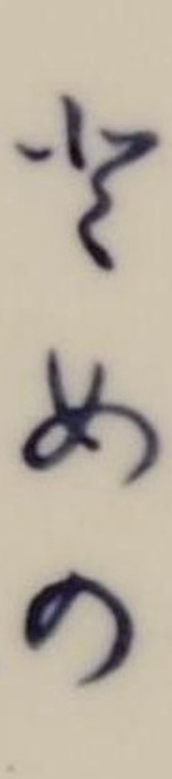とめの
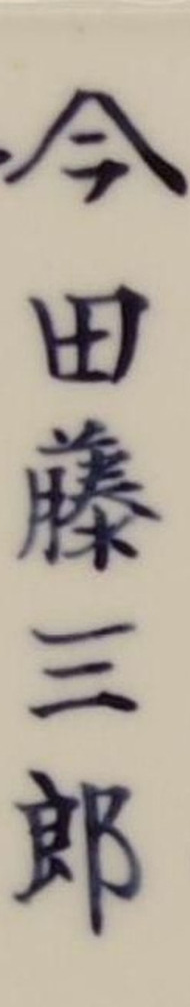今田藤三郎

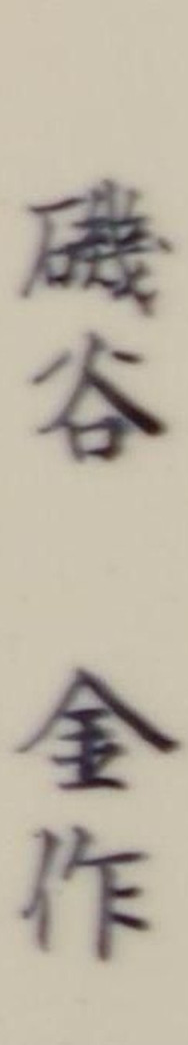磯谷金作
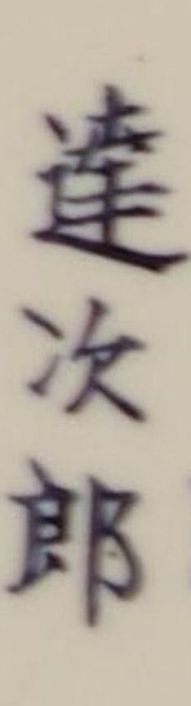逢次郎
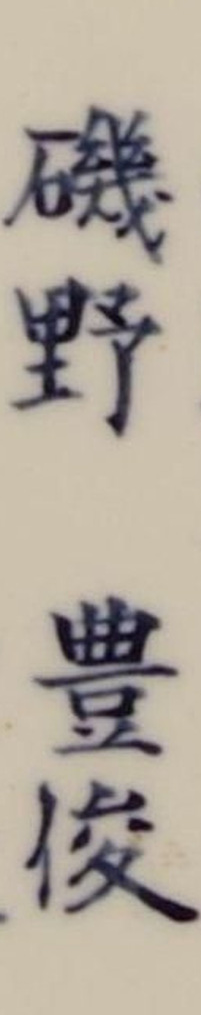磯野豊俊
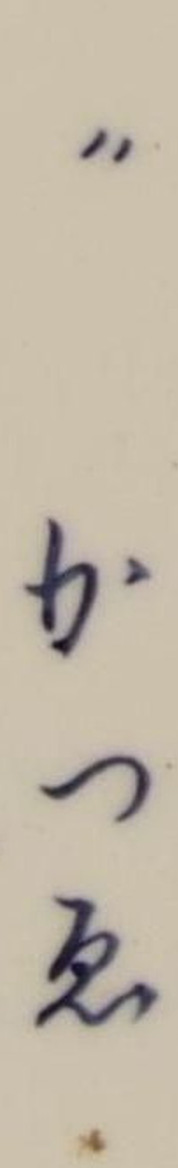かつえ
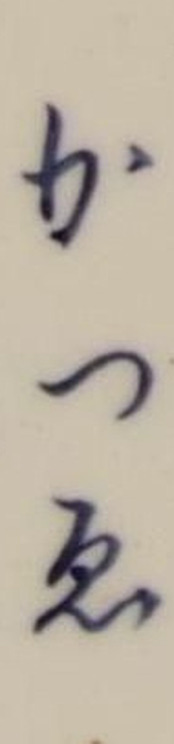かつえ

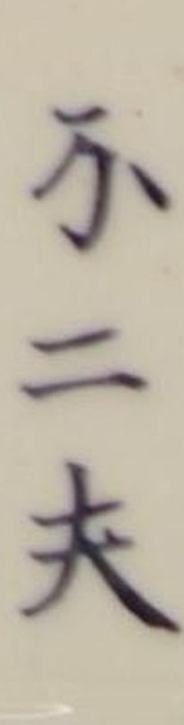不二夫
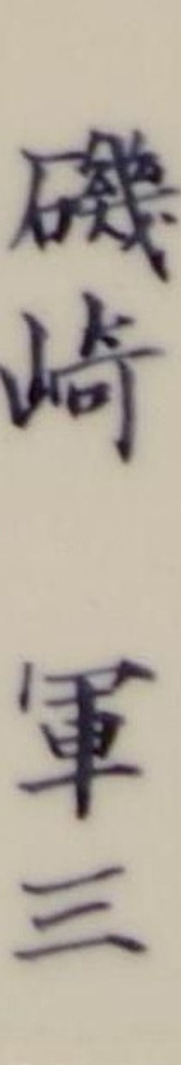磯崎軍三
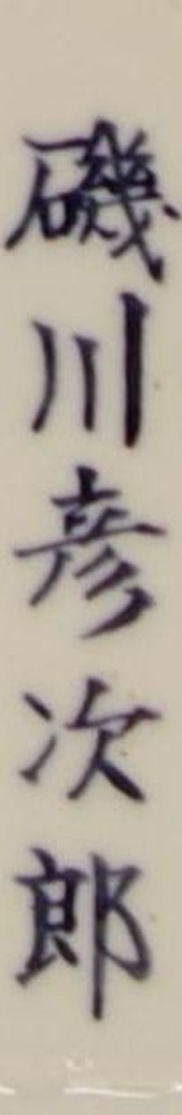磯川彦次郎
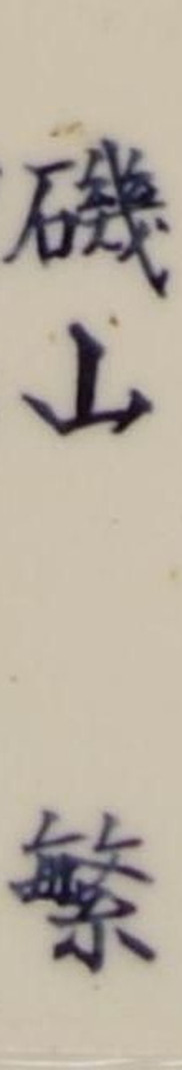磯山繁
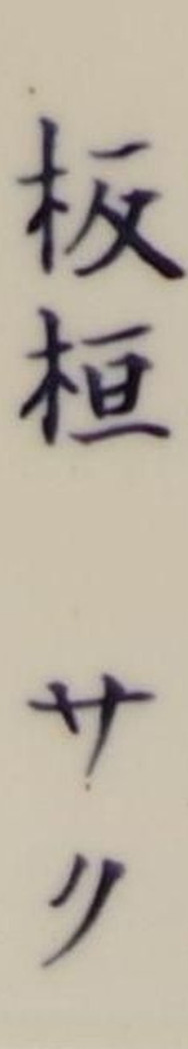板垣サク
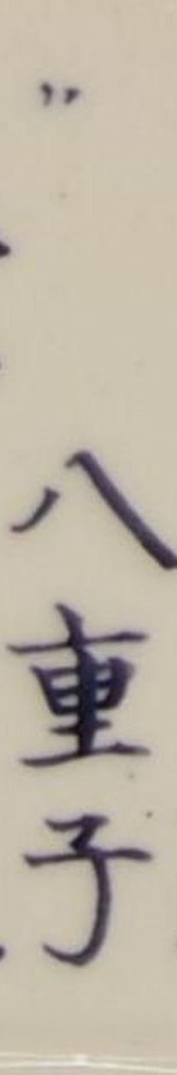八重子
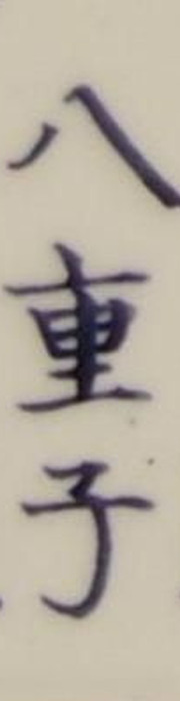八重子
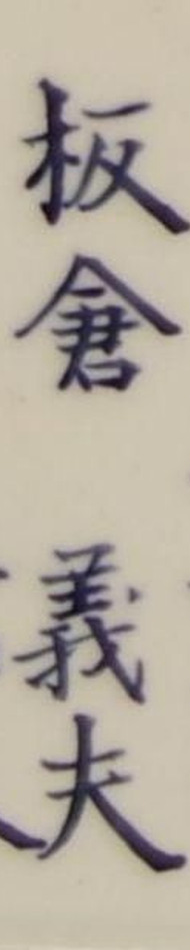板倉義夫

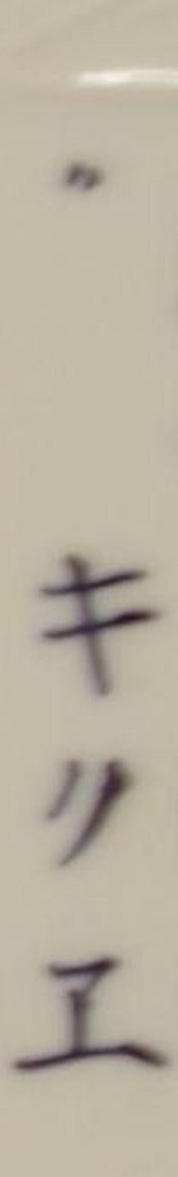キクエ
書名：M~S
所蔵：高野山金剛峯寺
